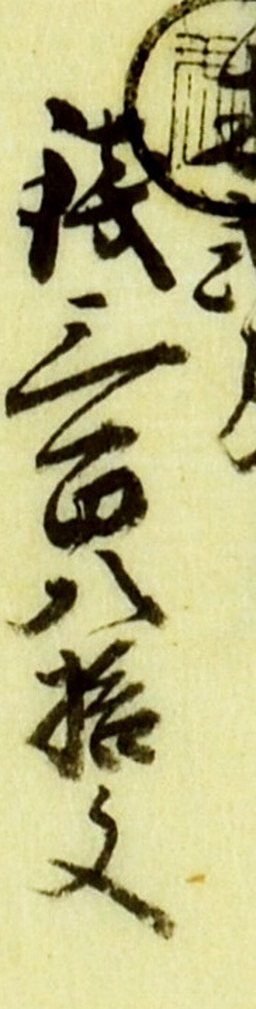銭三百八拾文
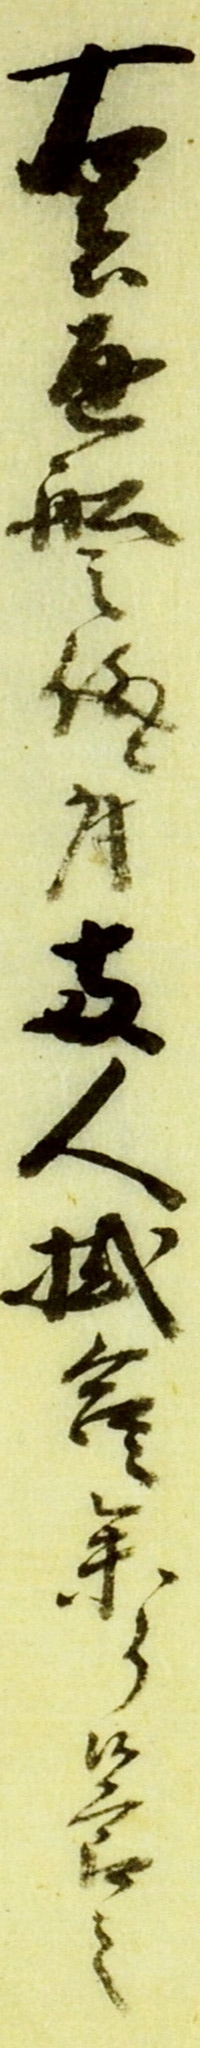右者通船之儀ニ付両人掛合ニ参り候節之
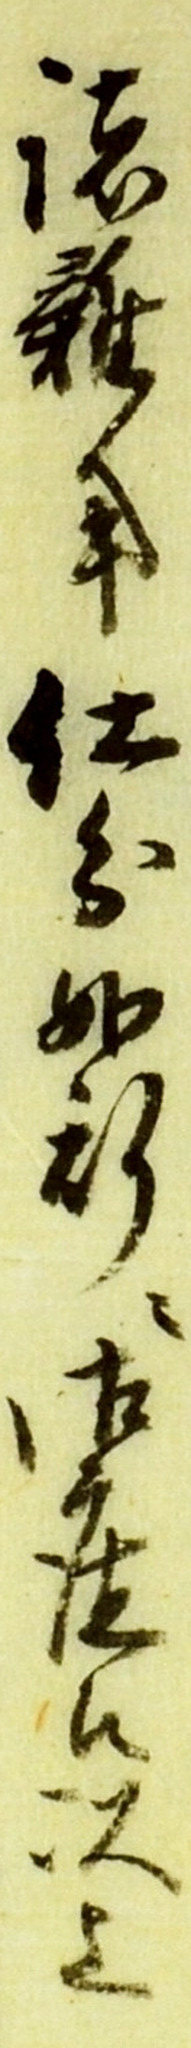諸雑用仕分如斯ニ御座候以上
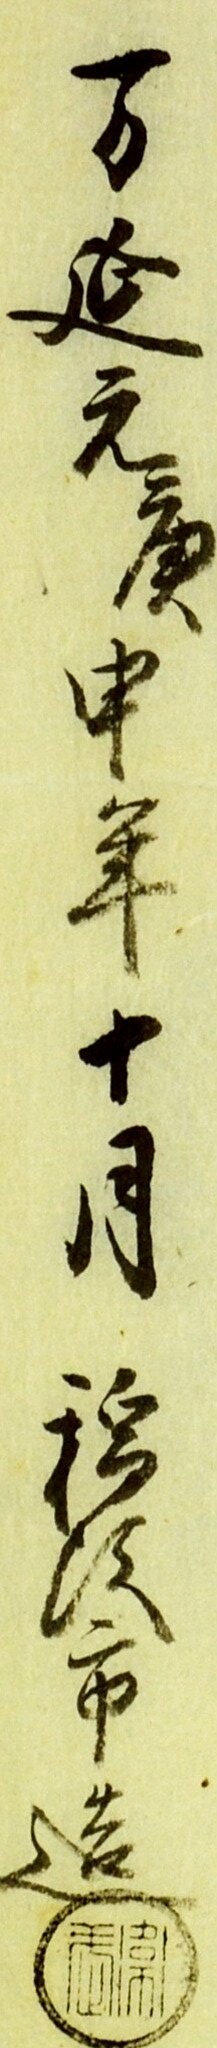万延元庚申年十月稲沢市造㊞
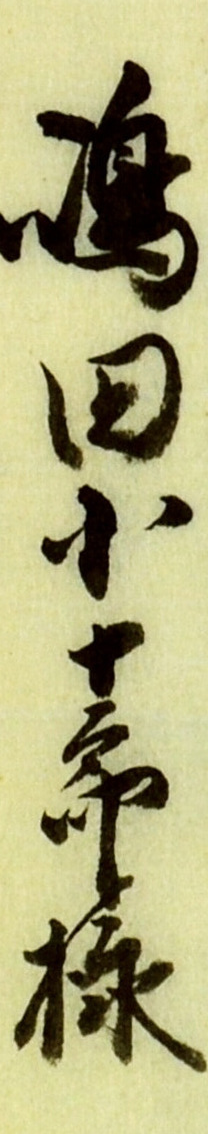嶋田小十郎様
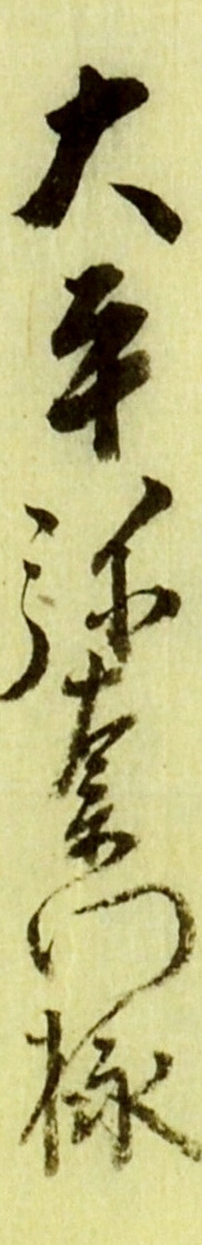大平弥右衛門様

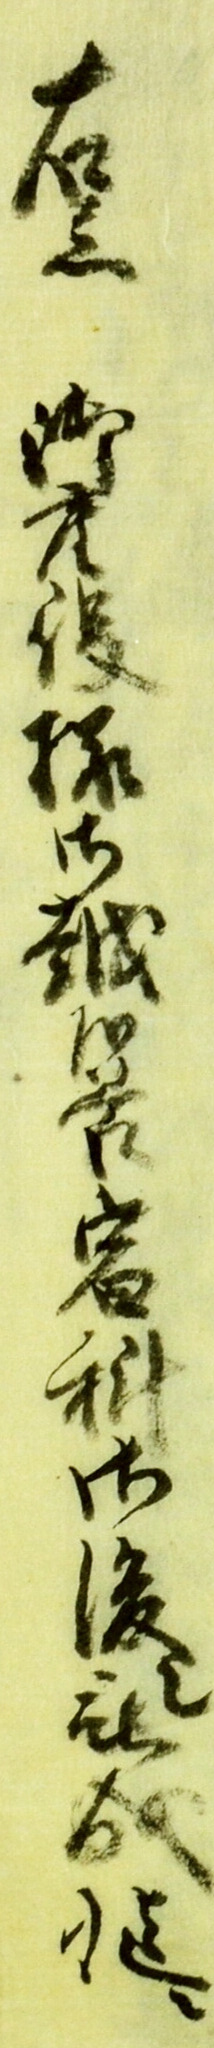右者御重役様御越候節宿料御渡シ被成慥ニ
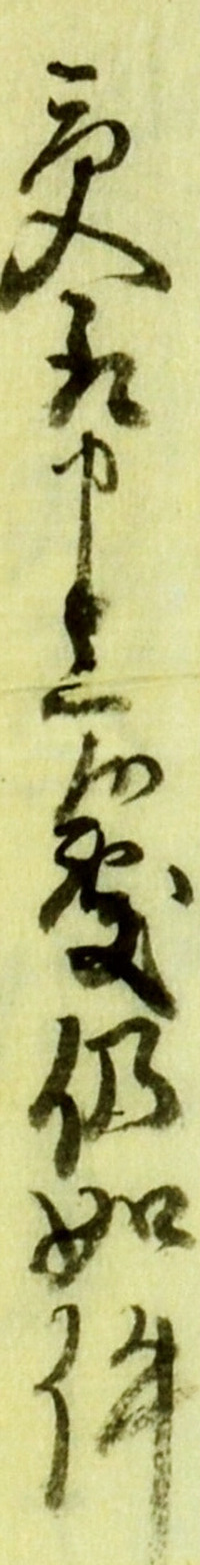受取申上候処仍如件
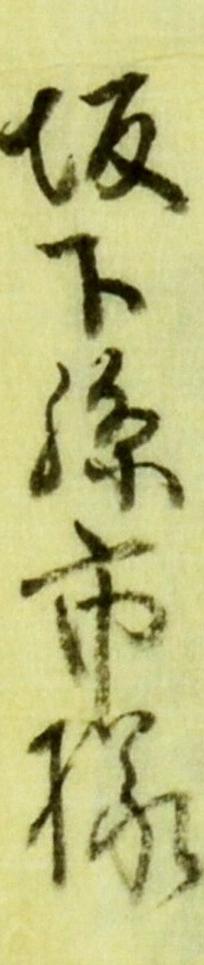坂下孫市様

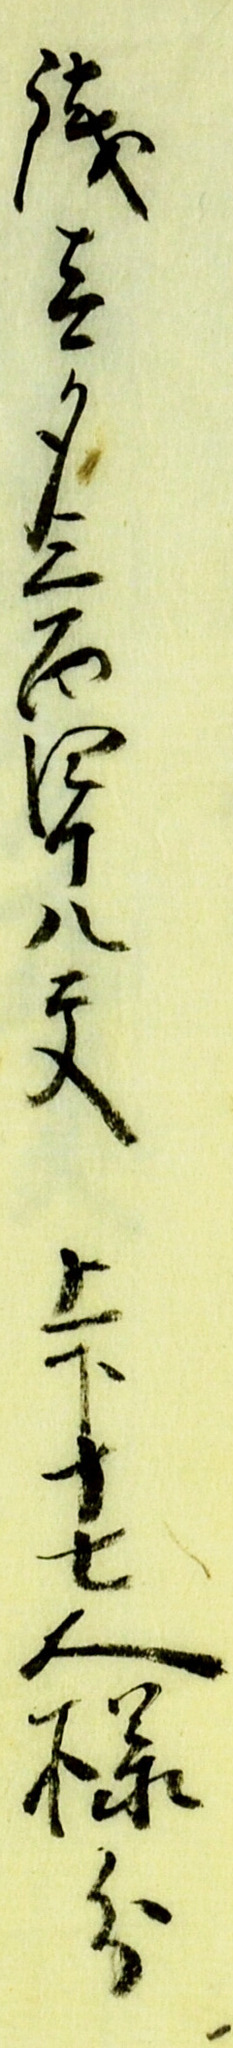銭壱貫三百四十八文上下十七人様分
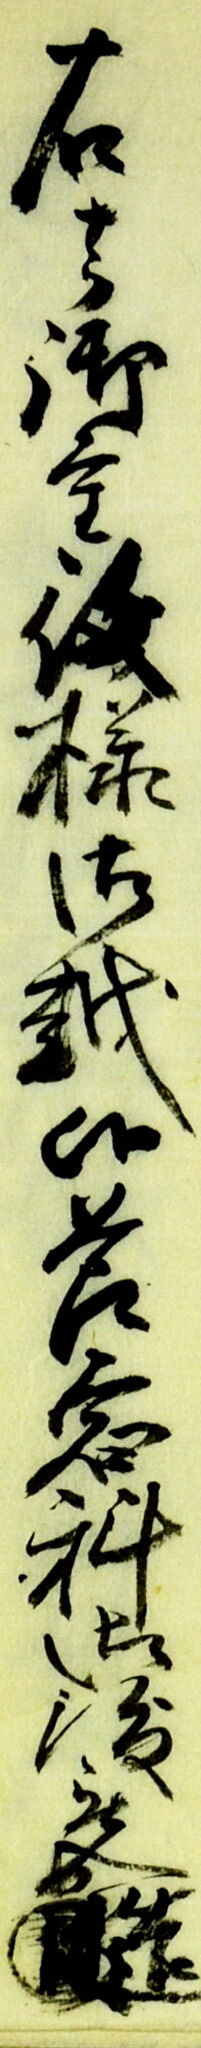右者御重役様御越候節宿料御渡被成慥ニ
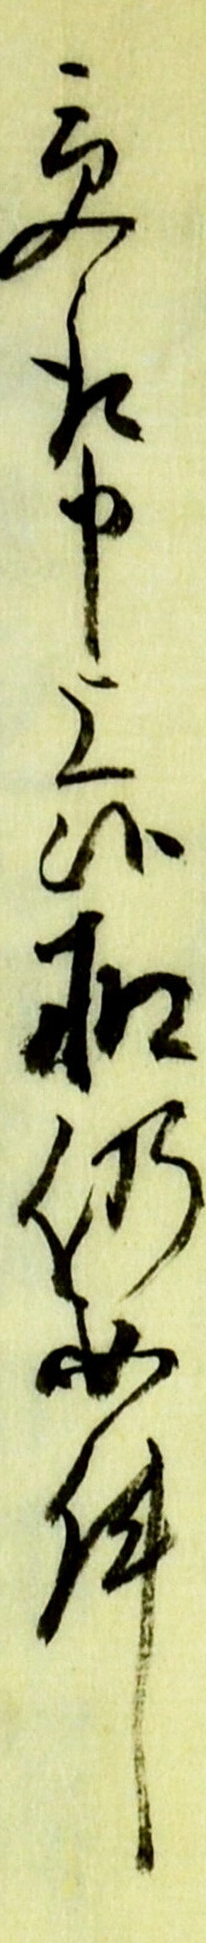受取申上候控仍如件
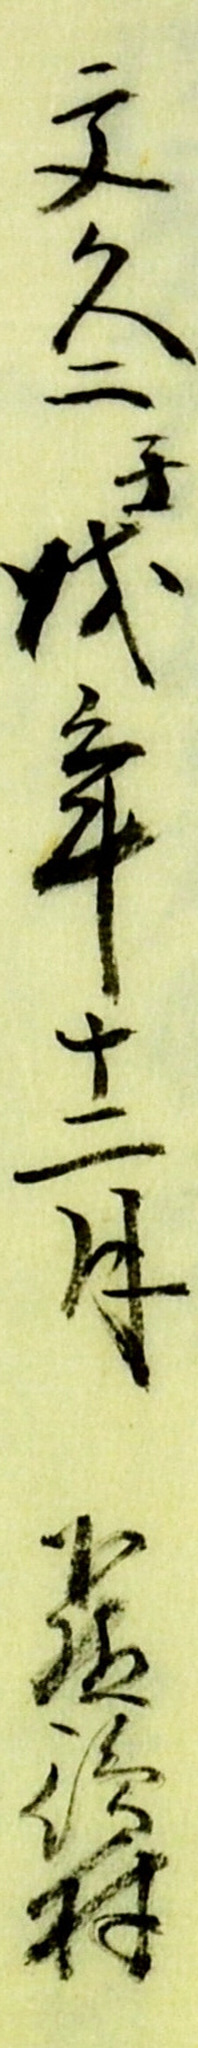文久二壬戌年十二月下殿嶋村
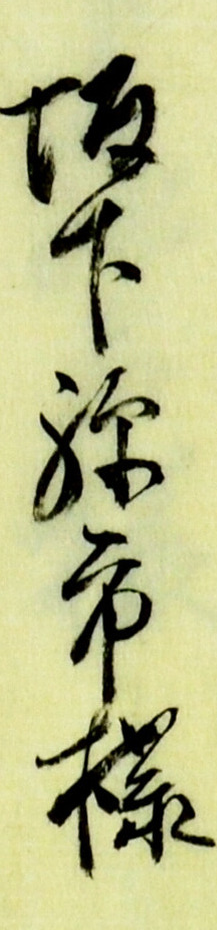坂下孫市様

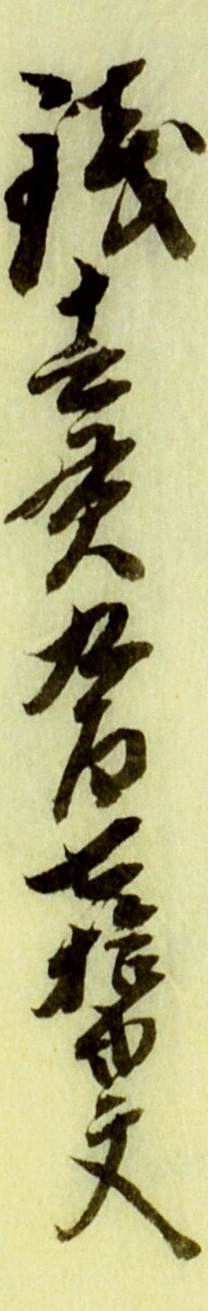銭壱貫九百七拾弐文
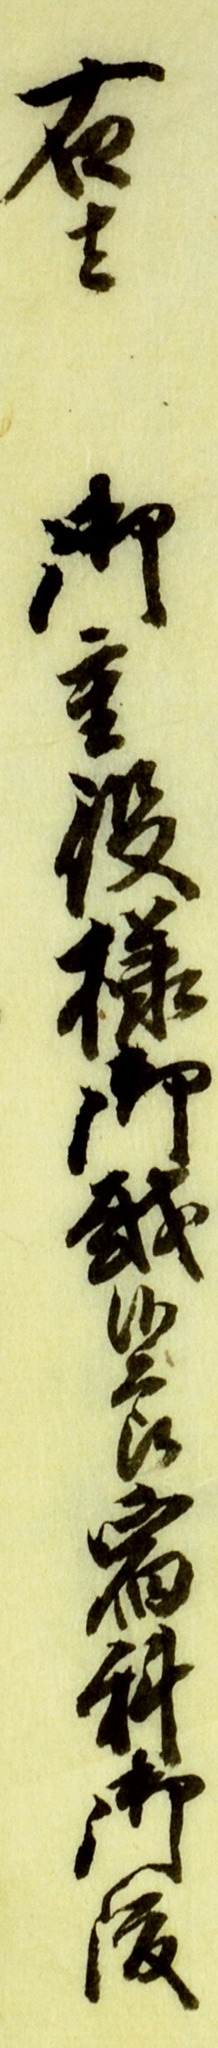右者御重役様御越候節宿料御渡
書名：覚
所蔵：伊那市立高遠町図書館・合同会社AMANE
